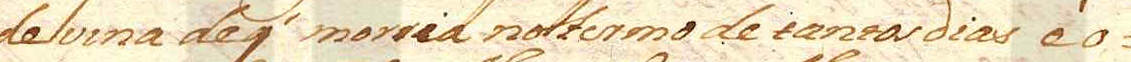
devina de q̄ morria no termo de tantos dias e o
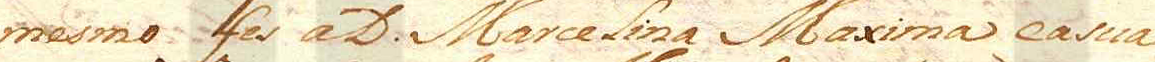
mesmo fes a D. MarceLina Maxima e a sua
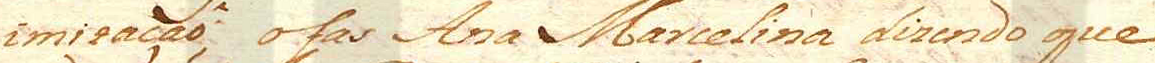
imitaçaõ, o fas Ana Marcelina dizendo que
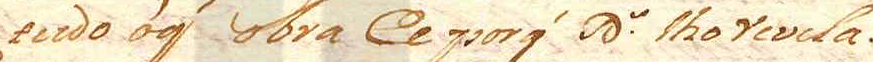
tudo o q̄ obra he porq̄ D.s lho revela.
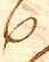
6
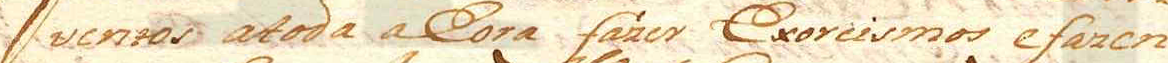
ventos a toda a hora fazer Exorcismos e fazen
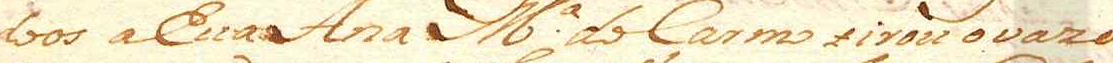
doos a hua Ana M.a do Carmo tirou o vazo
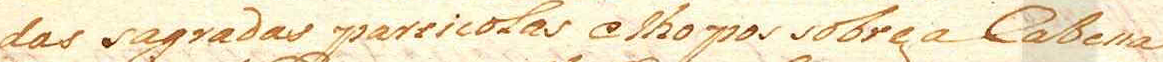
das sagradas particoLas e lho pos sobre a Cabessa
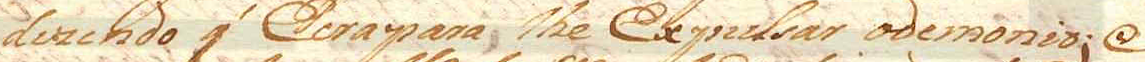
dizendo q̄ hera para lhe Expulsar o demonio; e
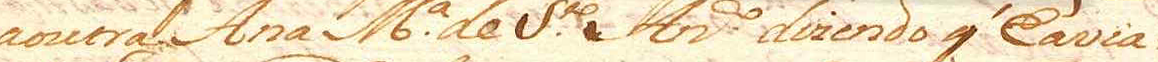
a outra Ana M.a de S.to An.to dizendo q̄ havia
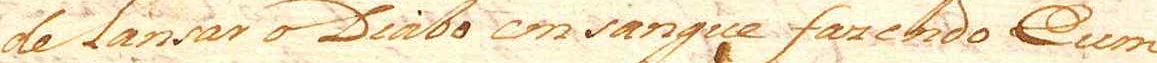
de Lansar o Diabo em sangue fazendo hum
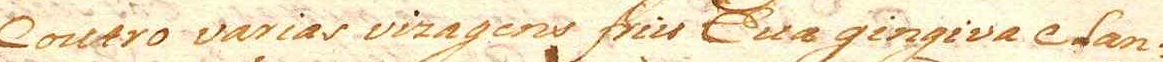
e outro varias vizagens friio hua gingiva e Lan
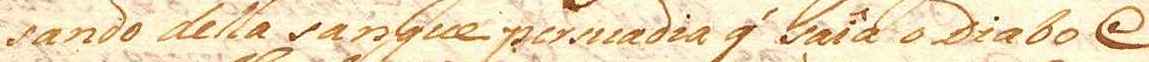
sando della sangue persuadia q̄ saia o Diabo e
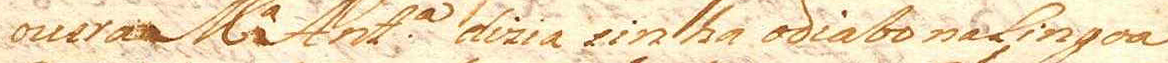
outra M.a Ant.a dizia tinha o diabo na Lingoa
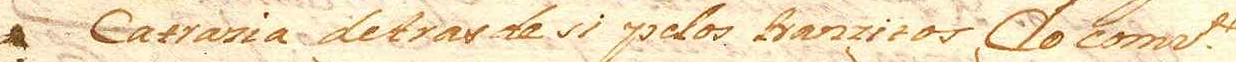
Ca trazia de tras de si pelos tranzitos do comv.to
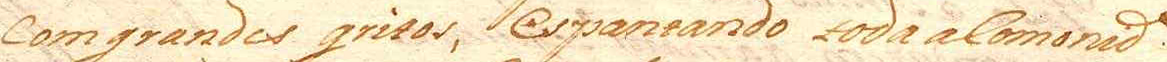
Com grandes gritos, espantando toda a Comonid.e
